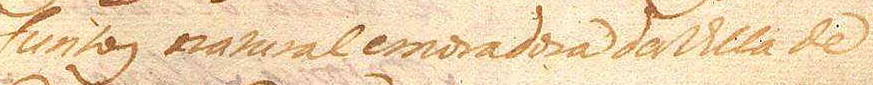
funtos natural e moradora da Villa de
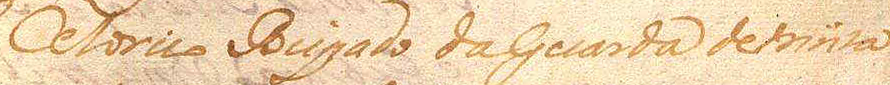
Celorico Bispado da Guarda de trinta
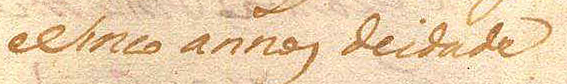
e sinco annos de idade.
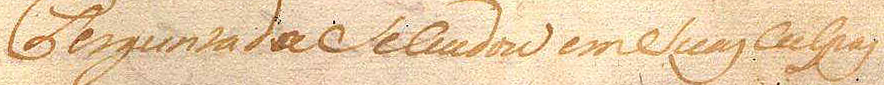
Perguntada se cuidou em suas culpas
